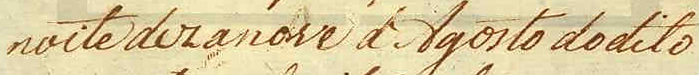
noite dezanove d̄ Agosto do dito
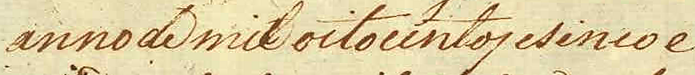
anno de mil oitocentos e sinco e
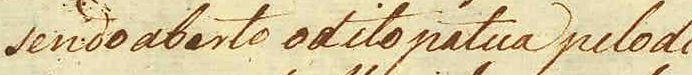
sendo aberto o dito patua pelo di
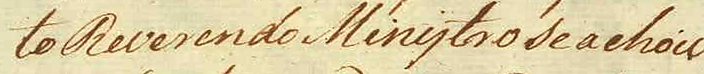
to Reverendo Ministro se achou
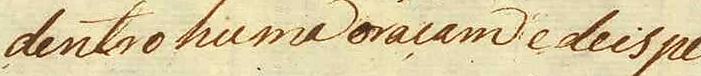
dentro huma oraçam e seis pe
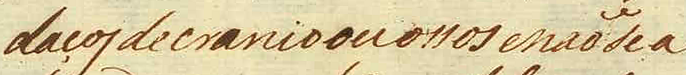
daços de cranio ou ossos e naõ se a
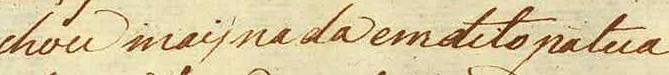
chou mais nada em dito patua
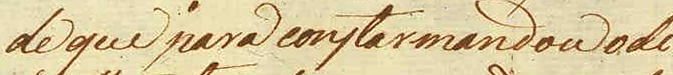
de que para constar mandou o di
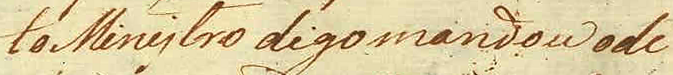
to Ministro digo mandou o di
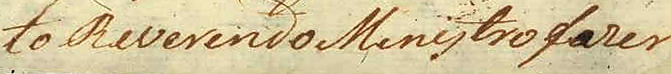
to Reverendo Ministro fazer
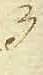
3
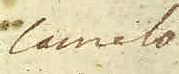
Camilo
